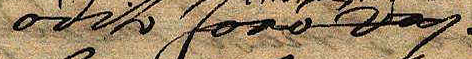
o dito Joaõ vaz
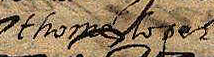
thome lopez
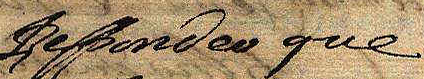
Respondeo que
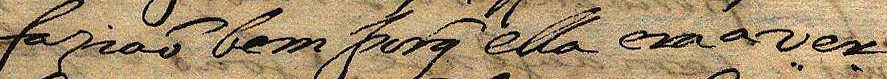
faziaõ bem porq̄ ella era a ver
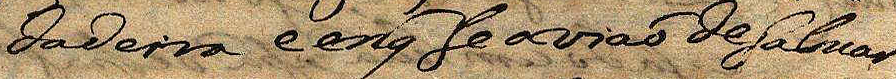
dadeira e en q̄ se aviaõ de saluar
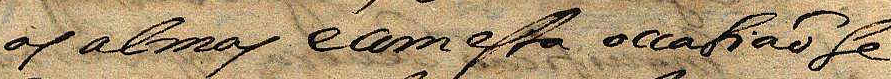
as almas e com esta occasiaõ se
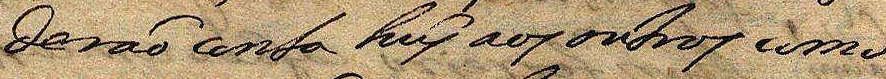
deraõ conta hus̄ aos outros como
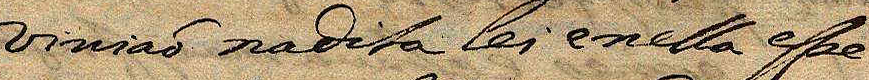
viuiaõ na dita lei e nella espe
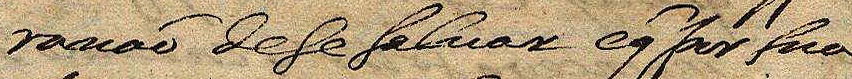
rauaõ de se saluar e q̄ por sua
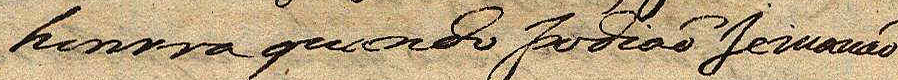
honrra quando podiaõ Jeiuauaõ
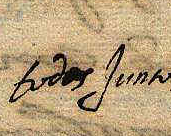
todos Juntos
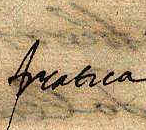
pratica
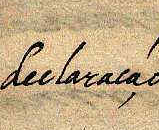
declaraçaõ
